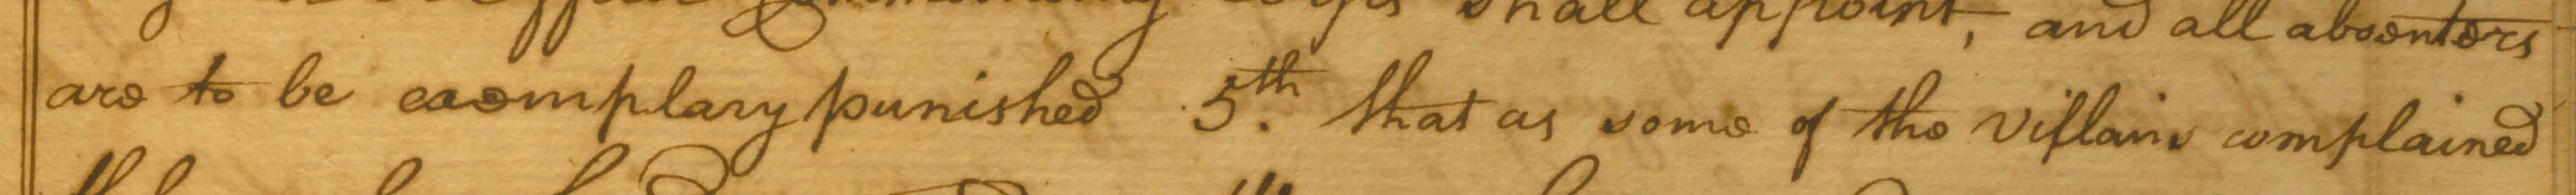are to be exemplary punished 5^th. that as some of the villains complained
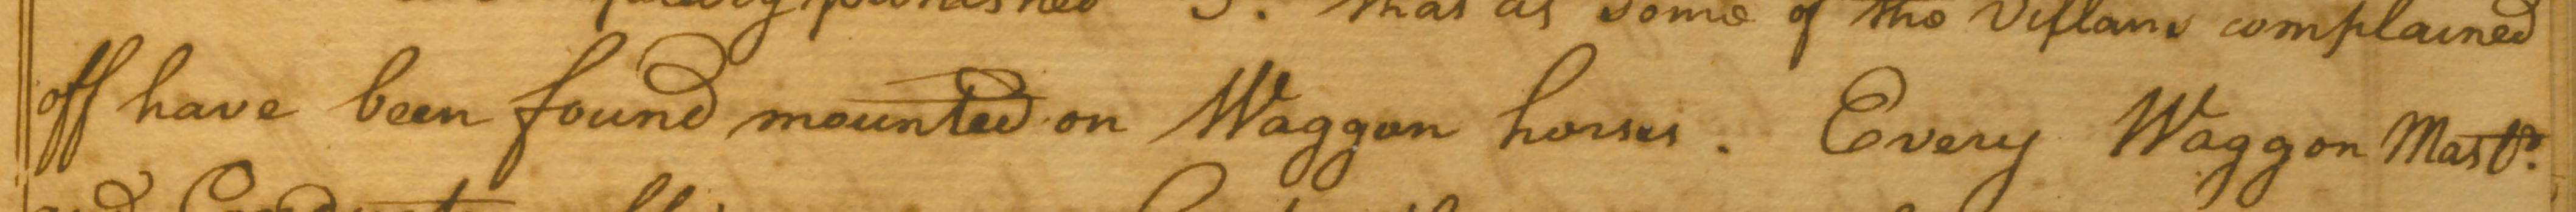off have been found mounted on Waggon horses. Every Waggon Mast^r.
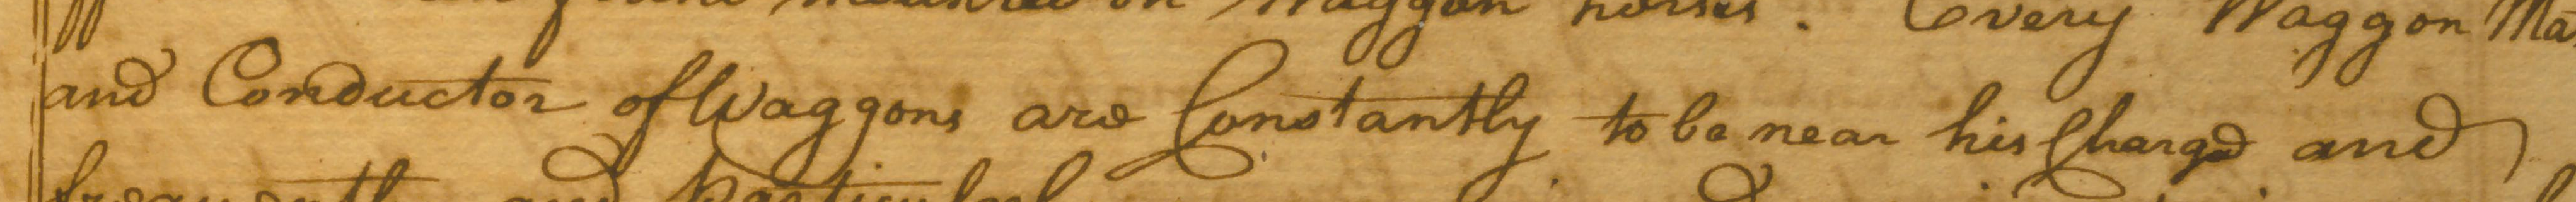and Conductor of Waggons are Constantly to be near his Charge and
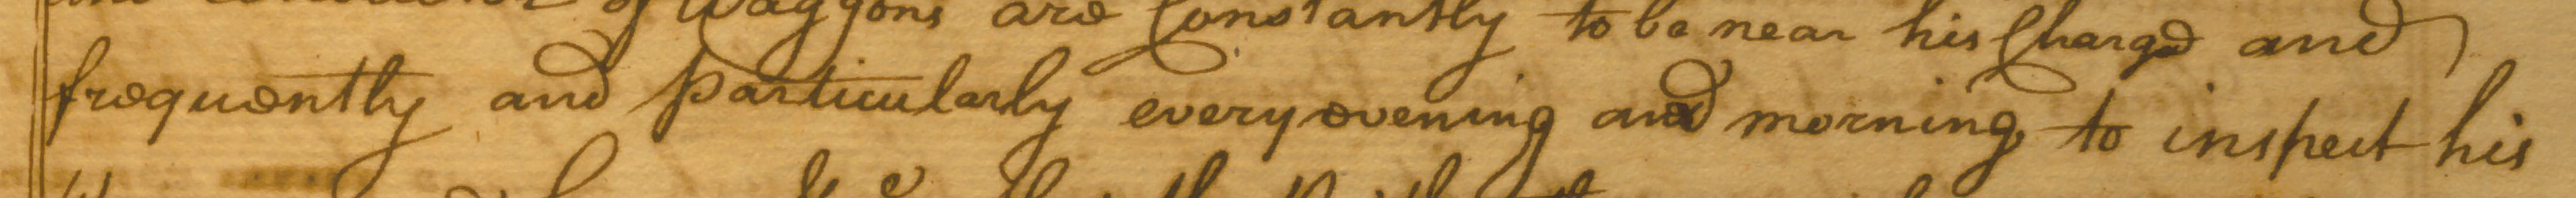frequently and particularly every evening and morning to inspect his
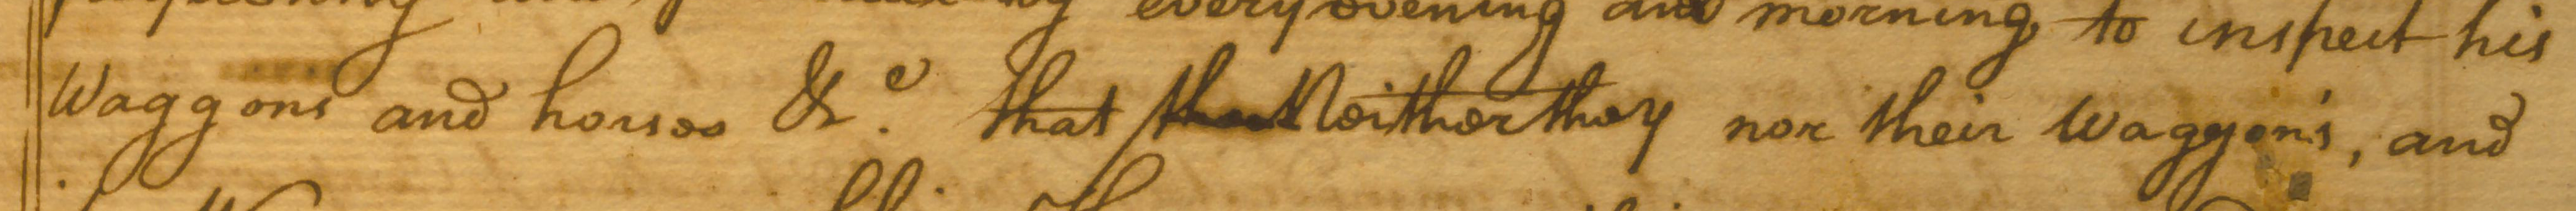Waggons and horses &c. that [the] neither they nor their waggon's, and
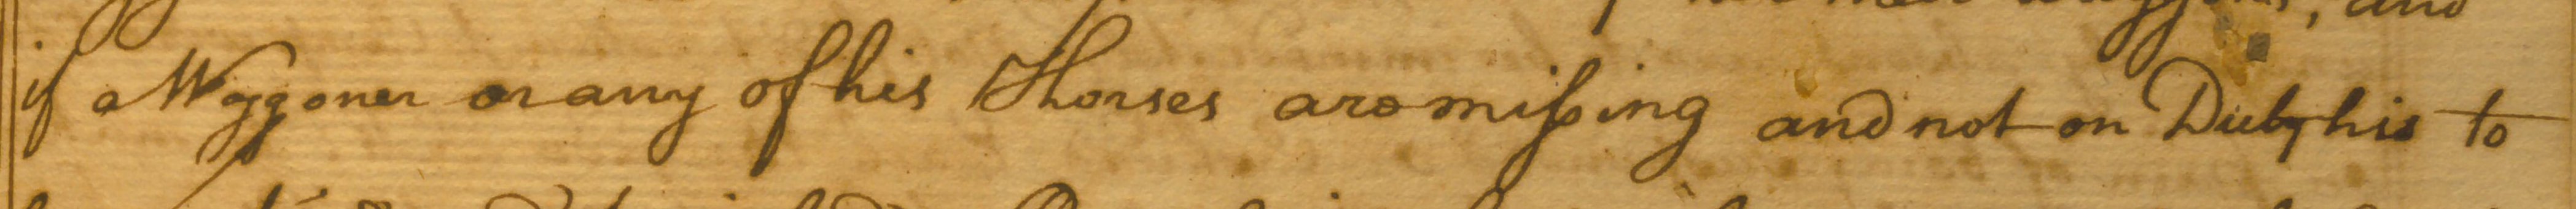if a Waggoner or any of his Horses are missing and not on Duty his to
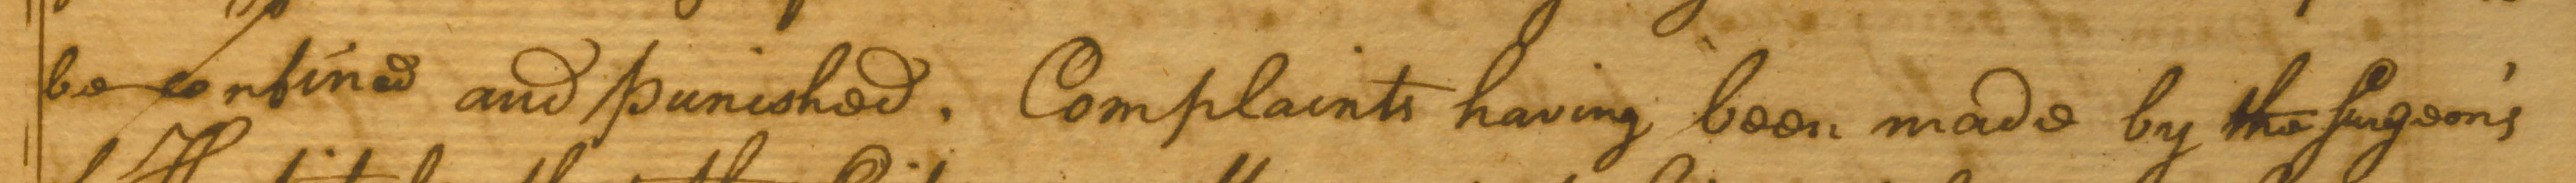be confined and punished. Complaints having been made by the Surgeon's
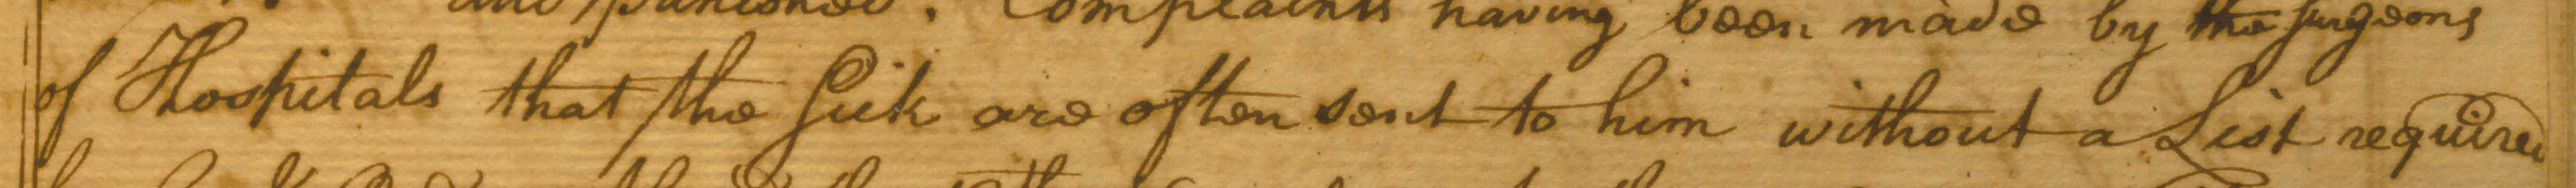of Hospitals that the Sick are often sent to him without a List required
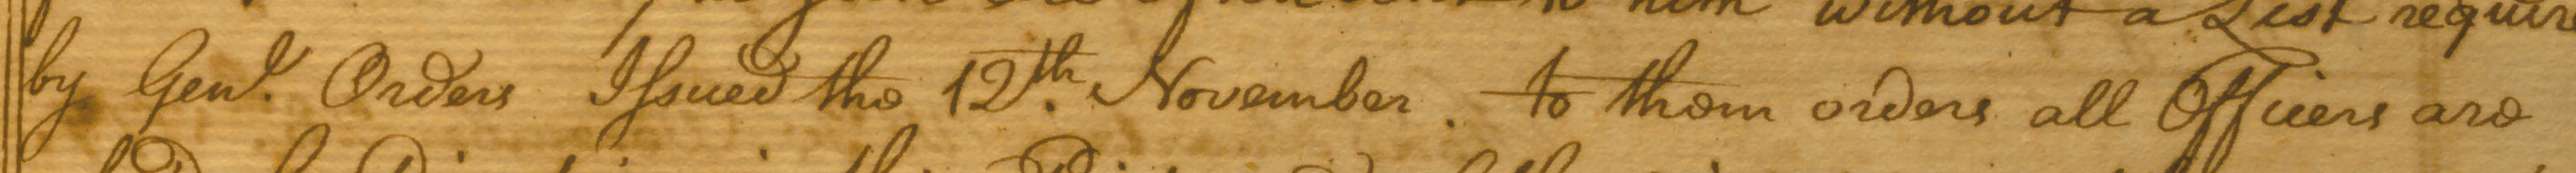by Gen^l. Orders Issued the 12^th. November. to these orders all Officers are
